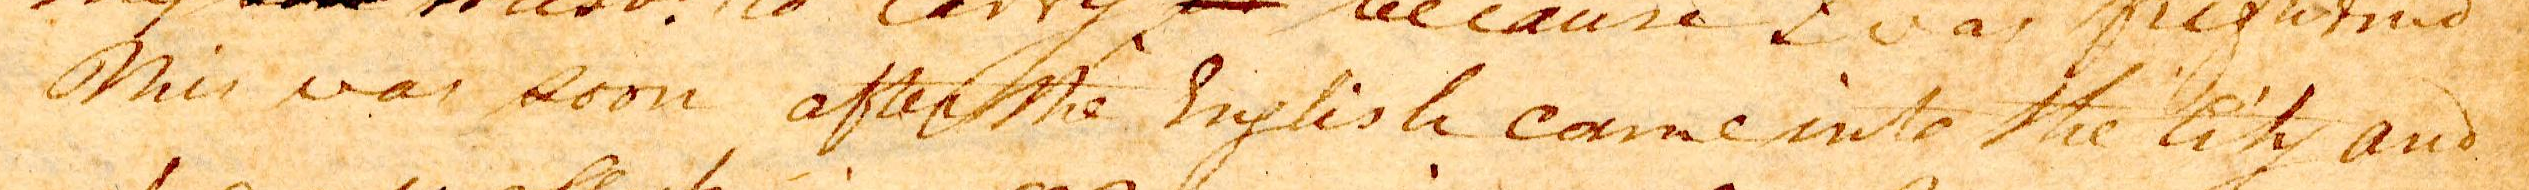This was soon after the English came into the City and
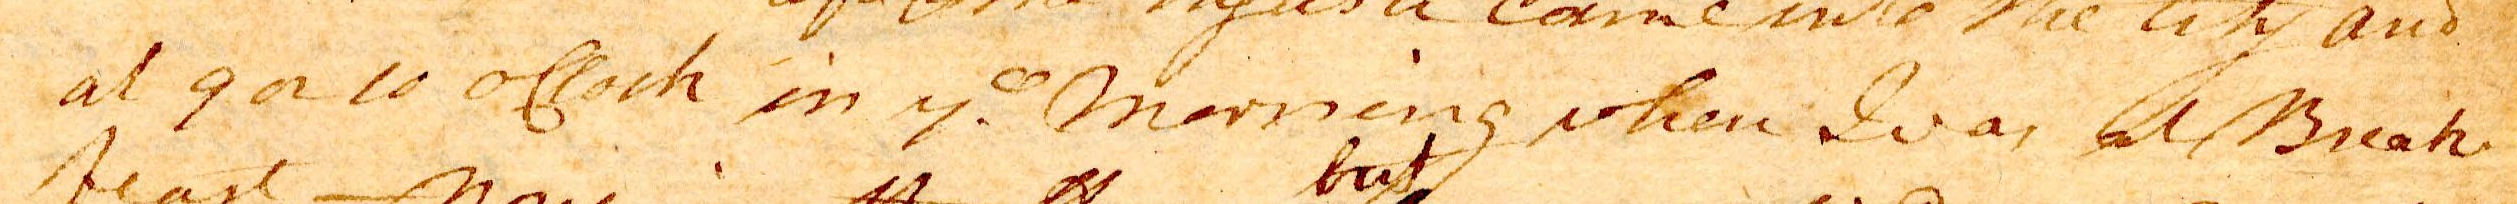at 9 or 10 oClock in y^e. Morning where I was at Break
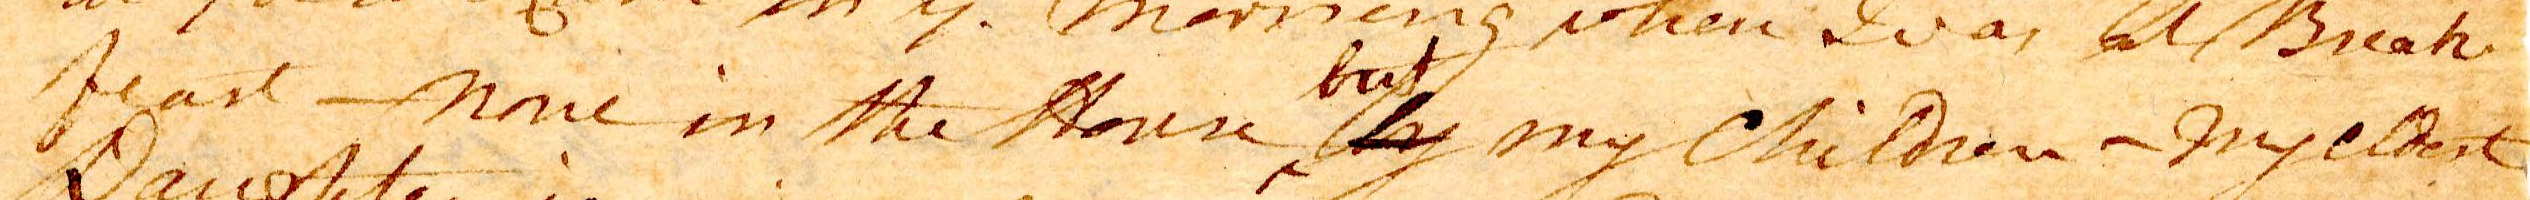fast -None in the house ^but [__] my Children -My eldest
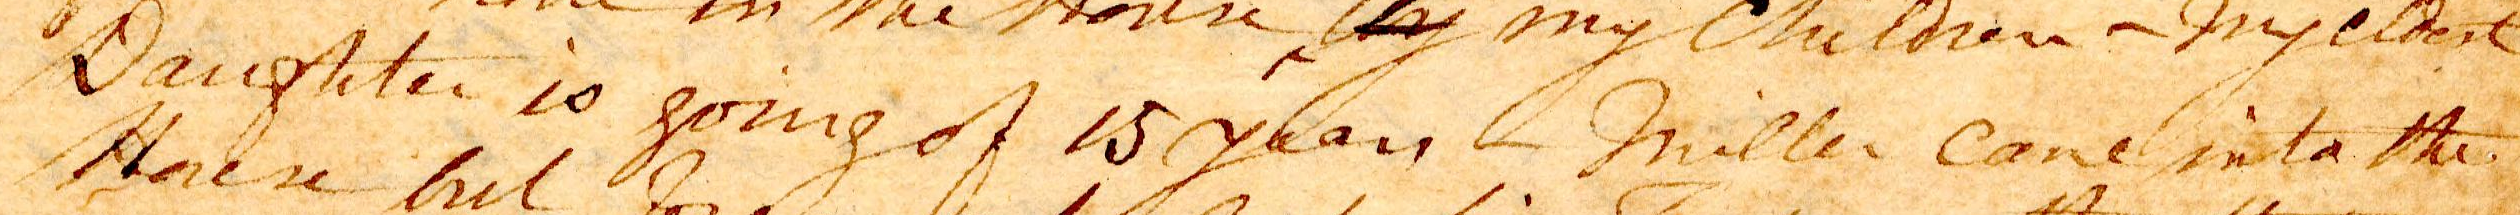Daughter is going of 15 years- Miller came into the
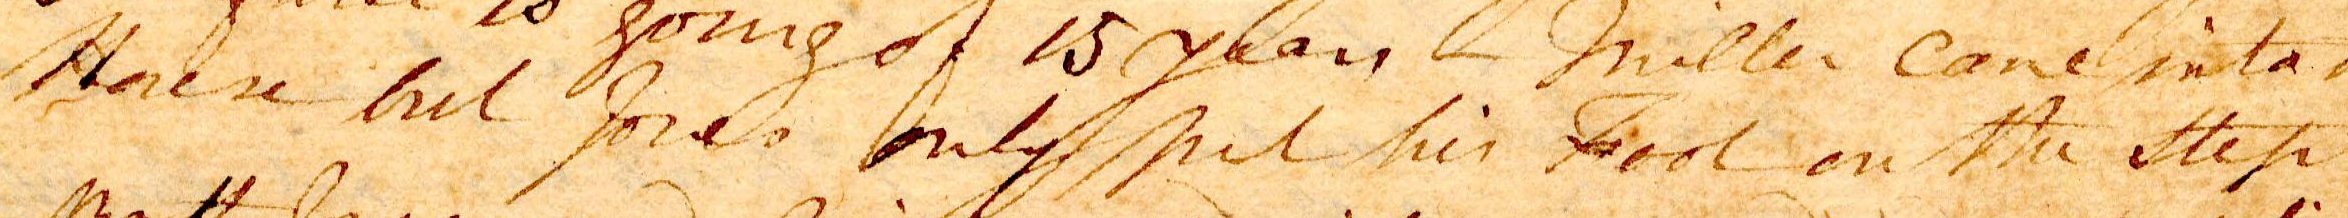House but Jones only put his foot on the step
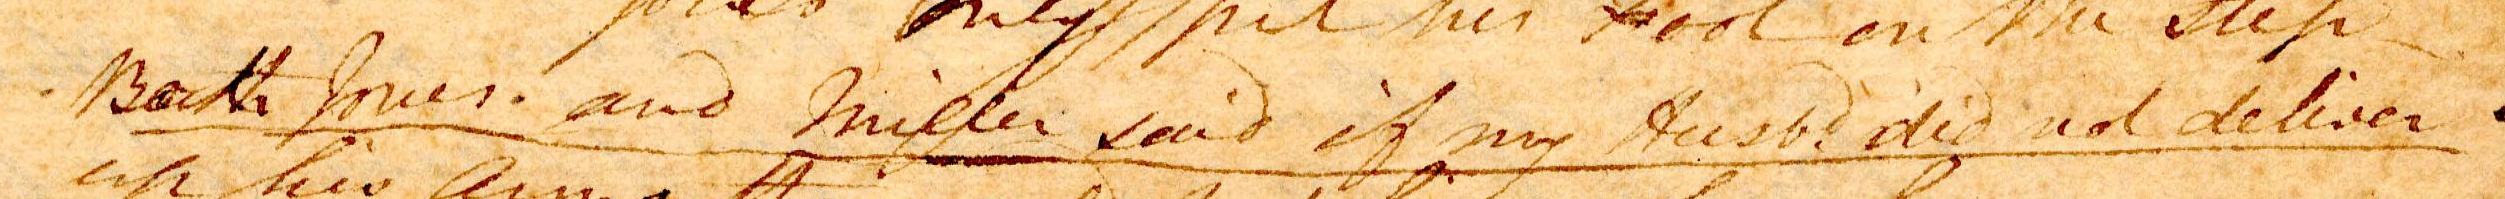Both Jones and Miller said if my Husb^d did not deliver
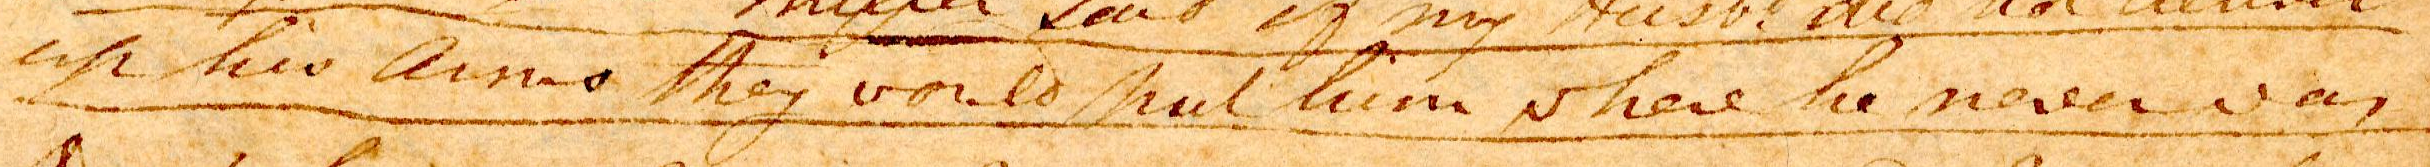up his Arms they would put him where he never was
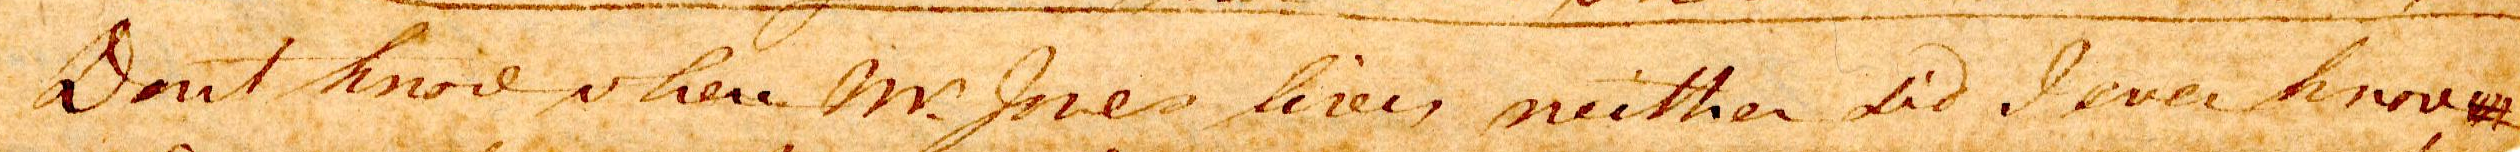Dont know where M^r. Jones lives neither did I ever know.
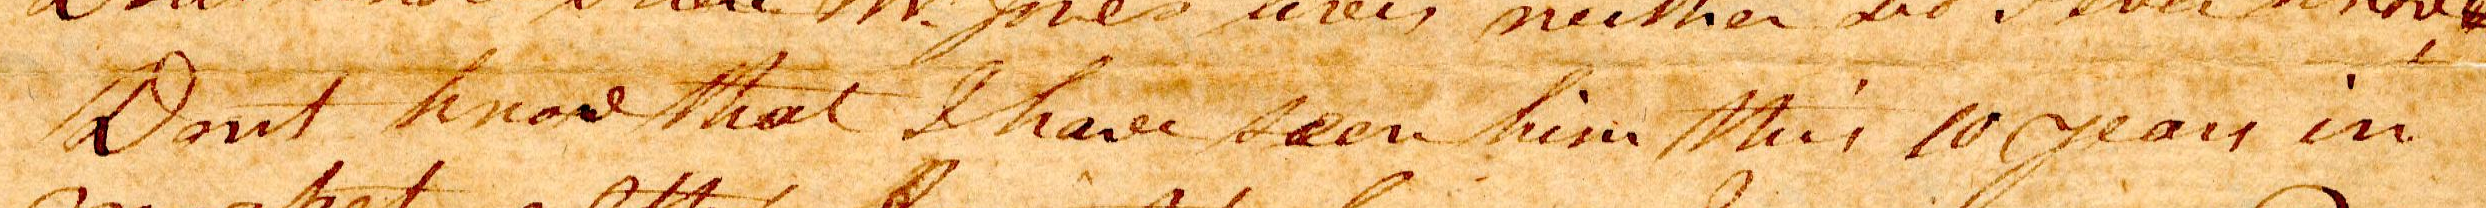Dont know that I have seen him this 10 years in
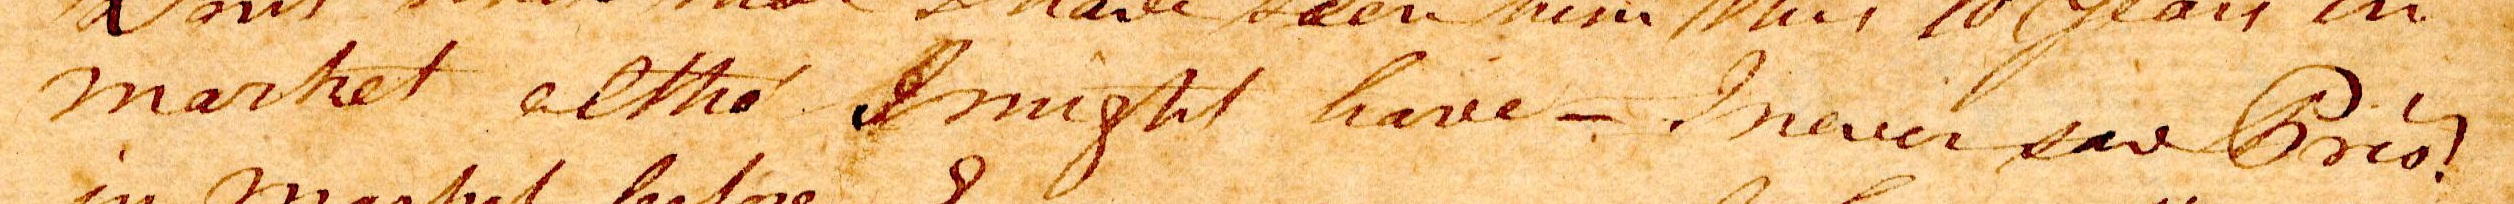Market altho' I might have- I never saw Pres
